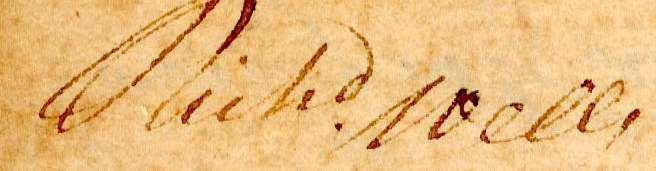Rich^d Wells
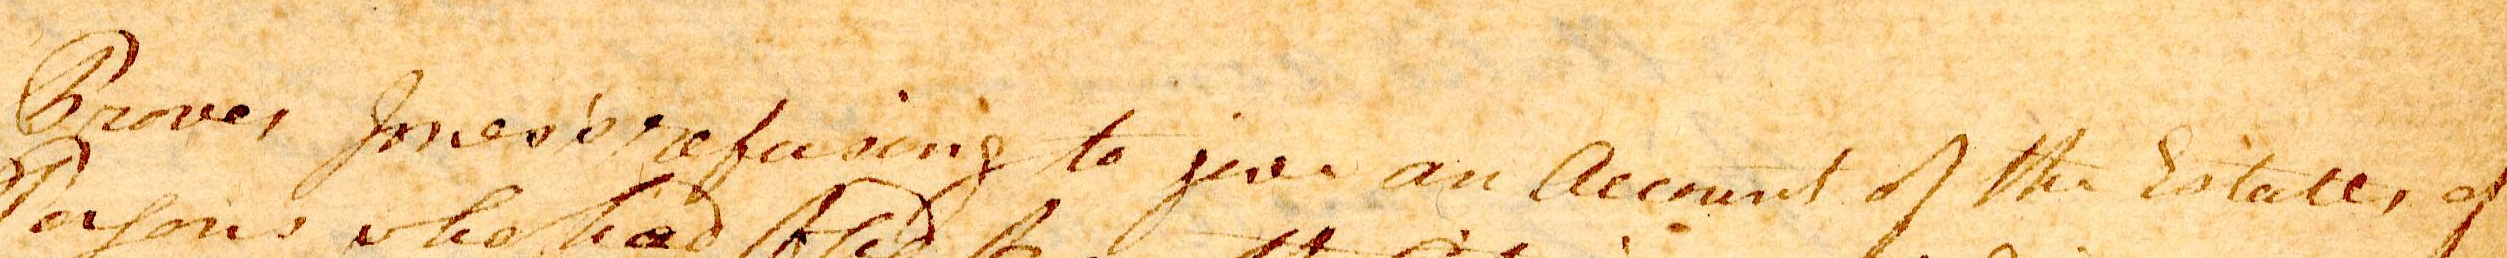Proves Jones refusing to give an Account of the Estates of
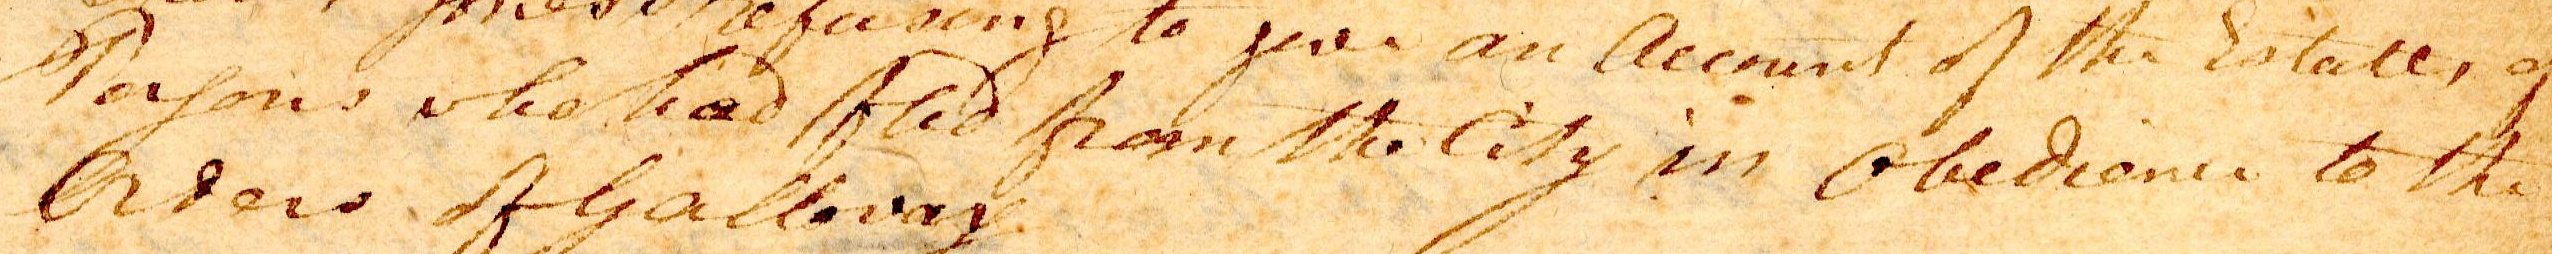Persons who had fled from the City in Obedience to the
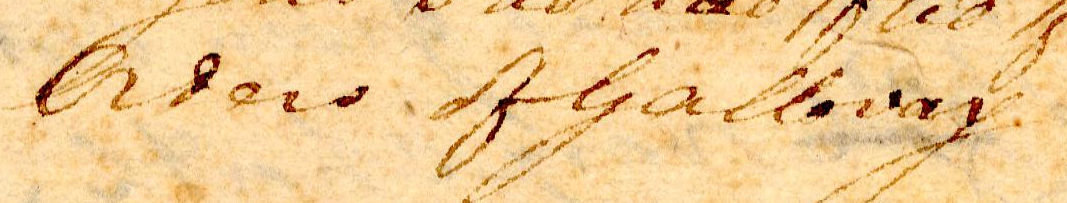Orders of Galloway
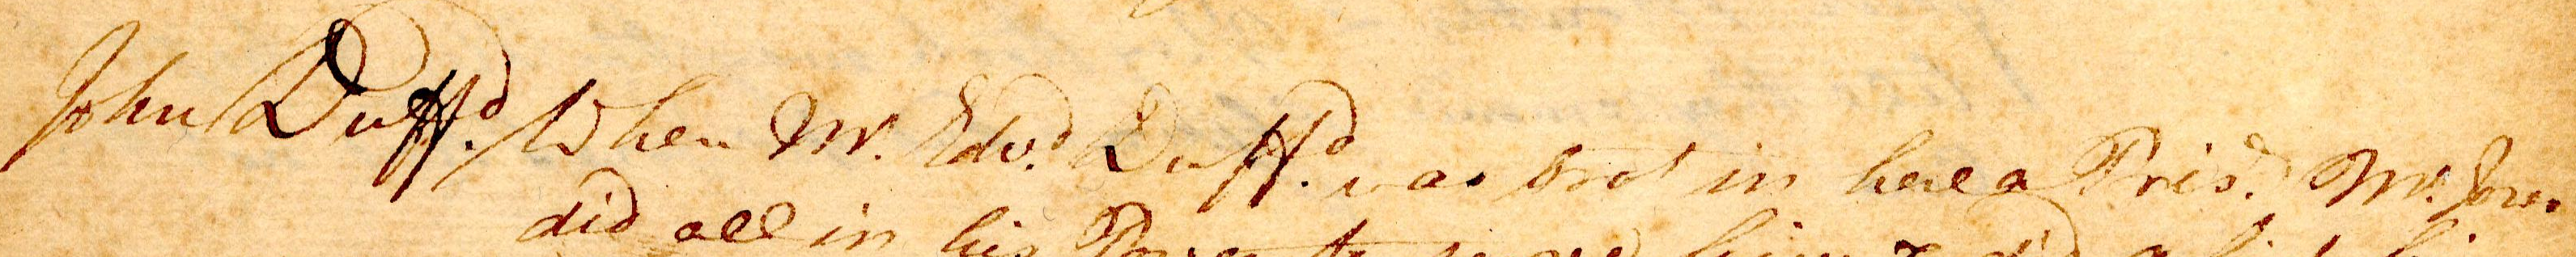John Duff^d When M^r. Edw^d. Duff^d. was bro't in here a Pres^d. M^r. Jones
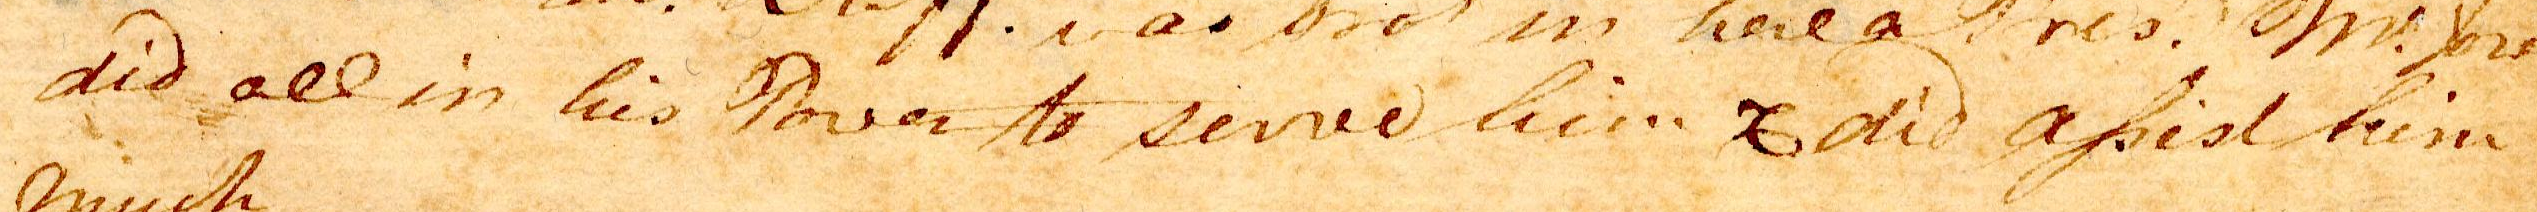did all in his Power to serve him & did assist him
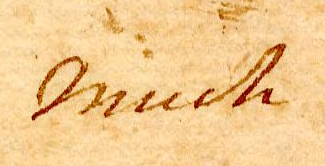much
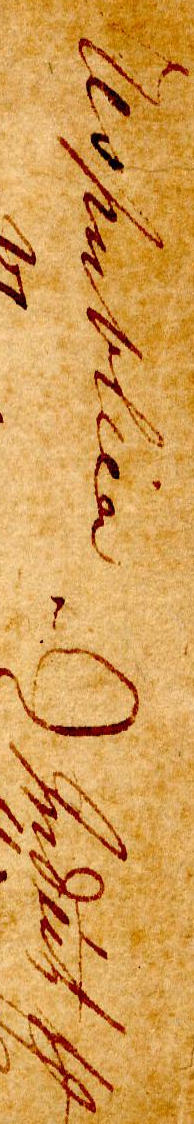Respublica Indict of
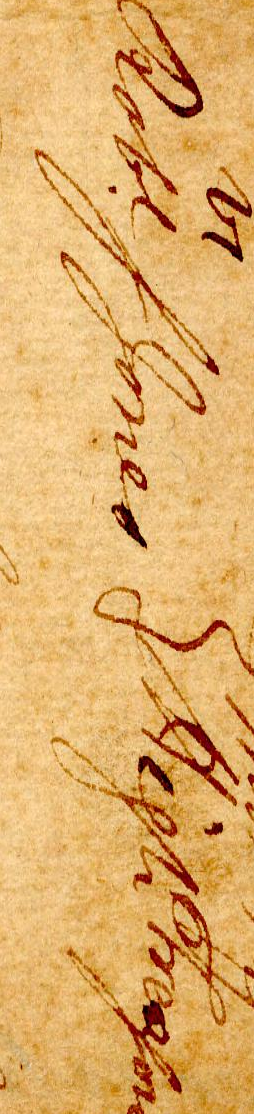Rob^t ^vs S Jones High Treason
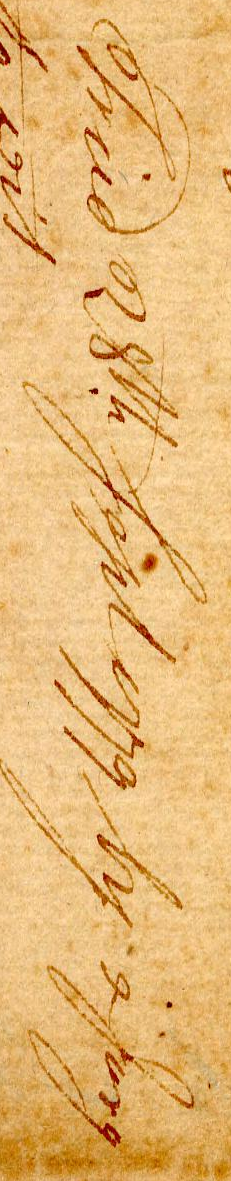Frid 28th Sept 1779 by a Jury
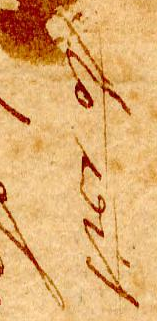to wit
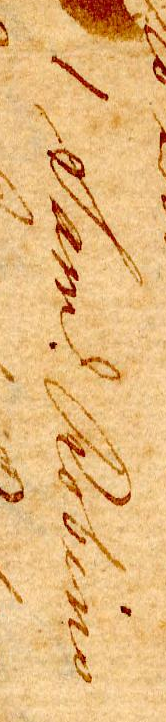Sam^l. Robins
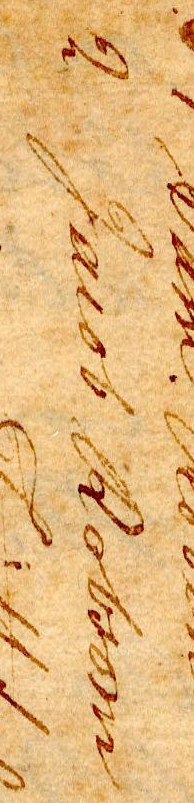2 Jacob Robsom
